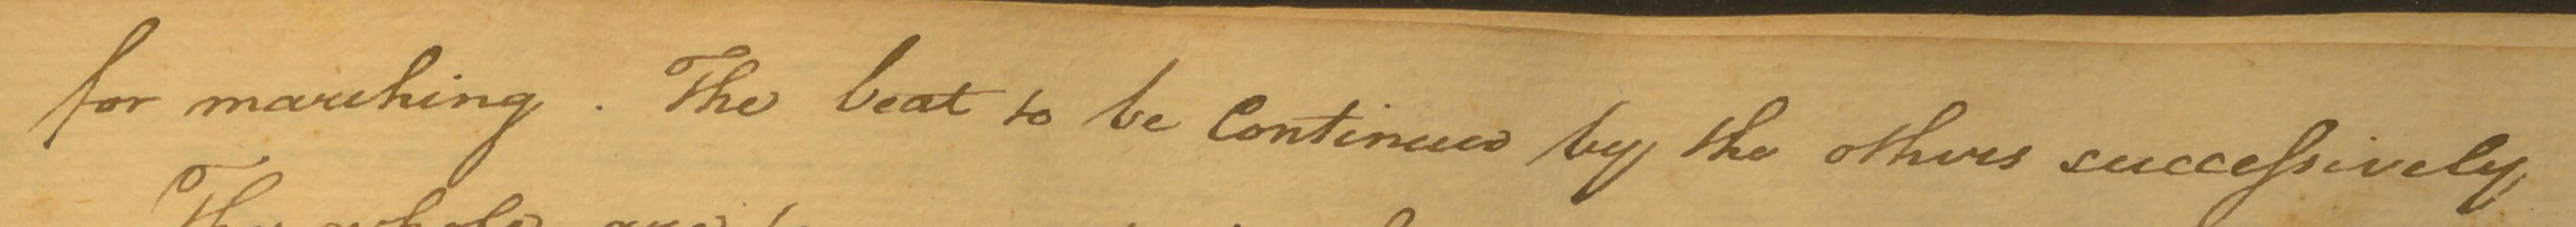for marching. The beat to be Continued by the others successively
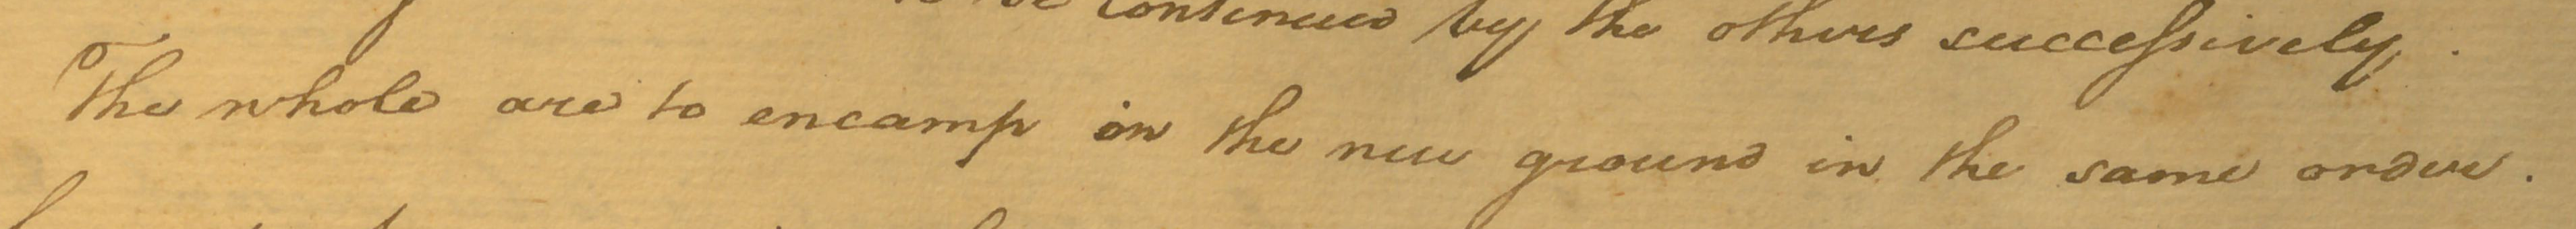The whole are to encamp on the new ground in the same order.
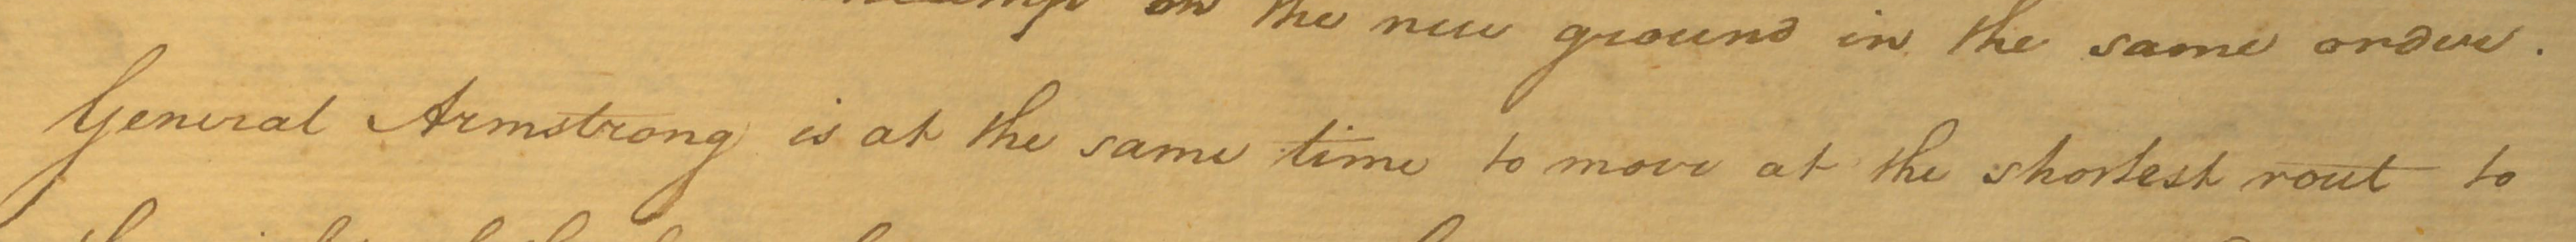General Armstrong is at the same time to move at the shortest rout to
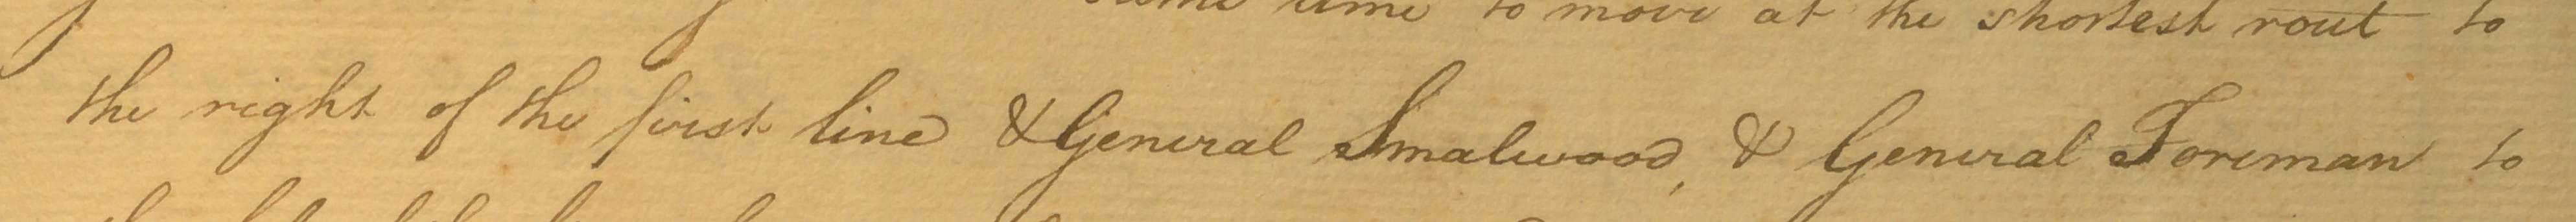the right of the first line & General Smalwood & General Foreman to
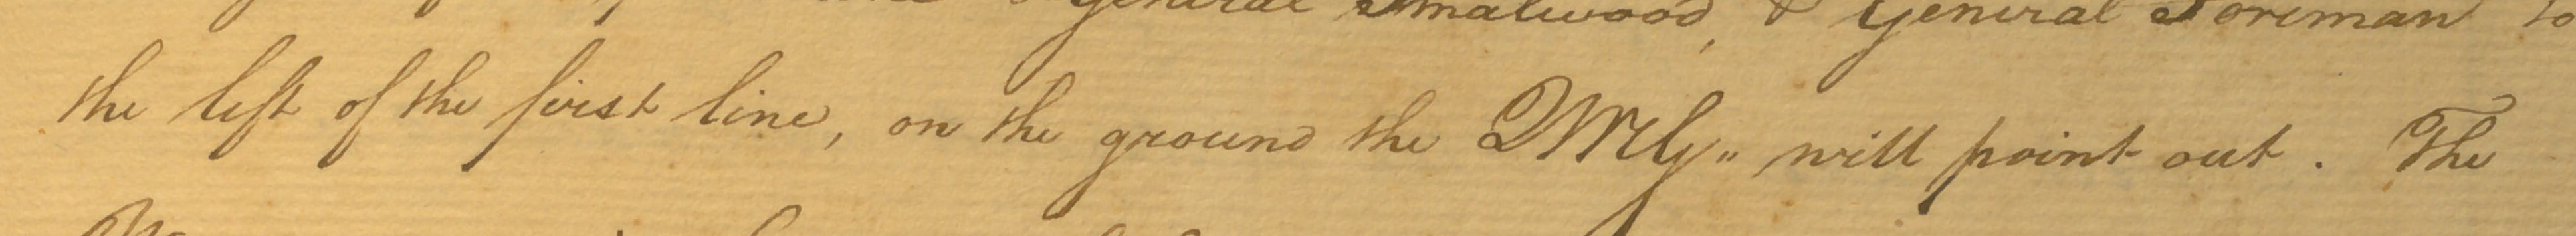the left of the first line, on the ground the QMG. will paint out. The
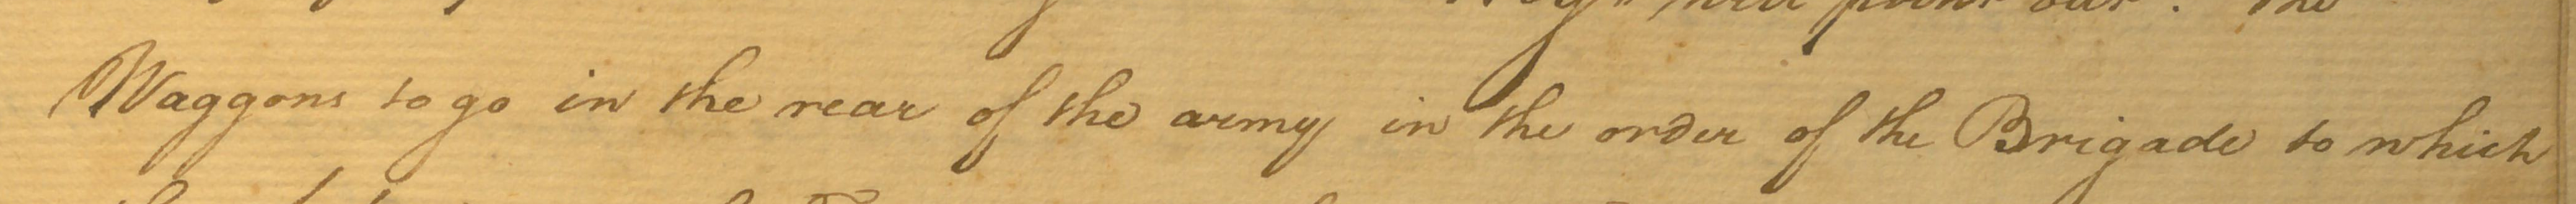Waggons to go in the rear of the army in the order of the Brigade to which
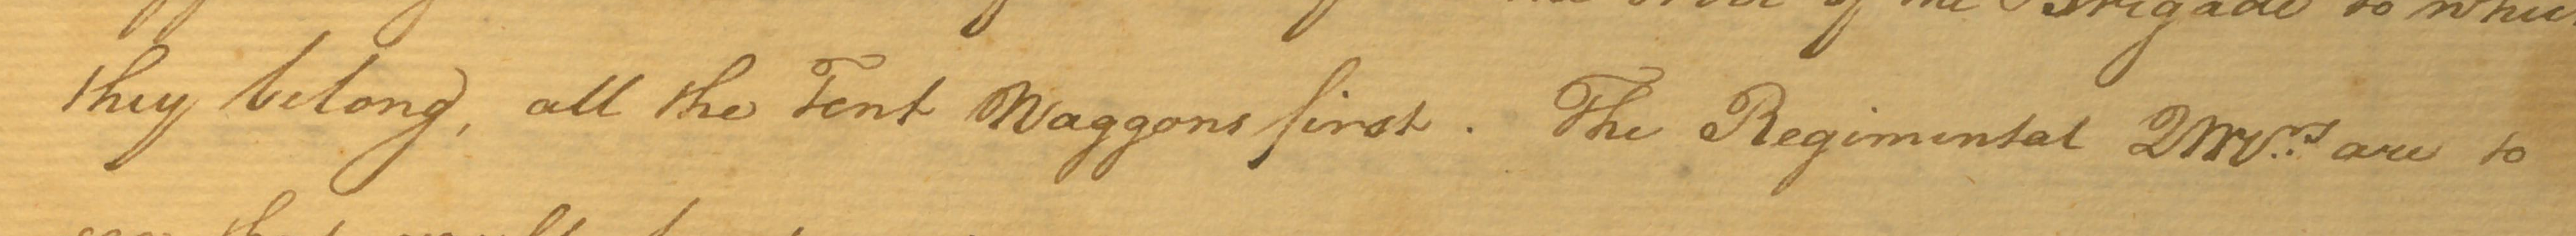they belong, all the Tent Waggons first. The Regimental QM^rs. are to
